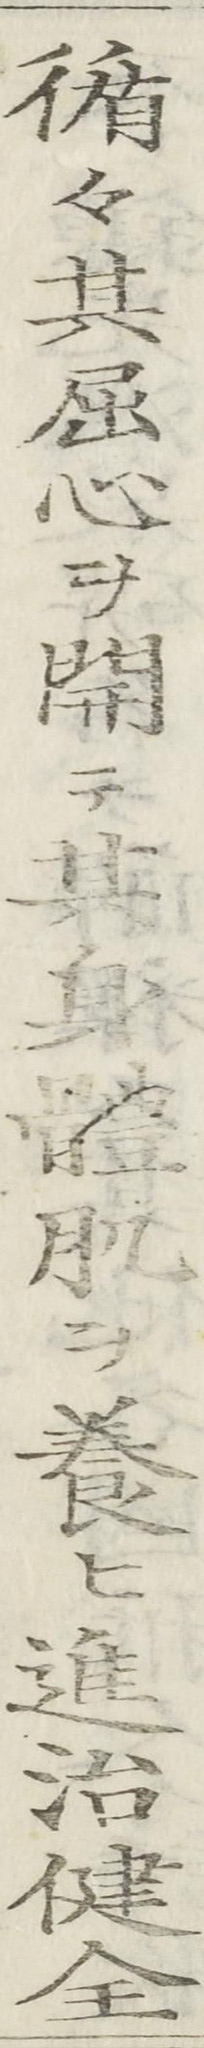循々其屈心ヲ開テ其身体肌ヲ養ヒ進治健全
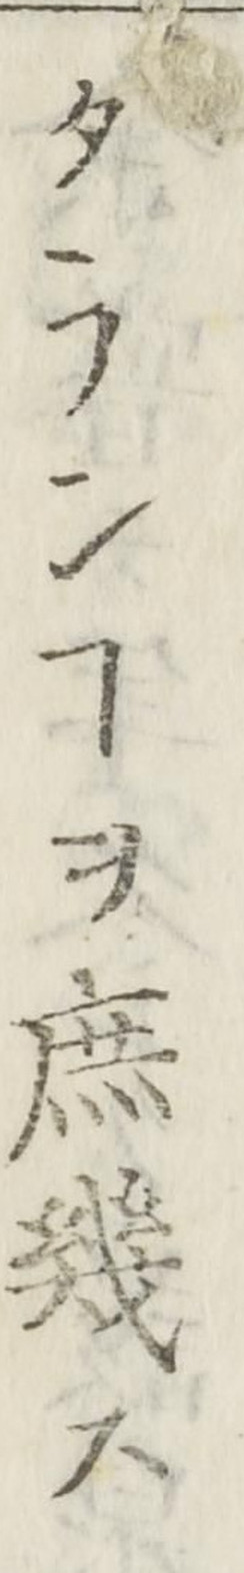タランヿヲ庶幾ス
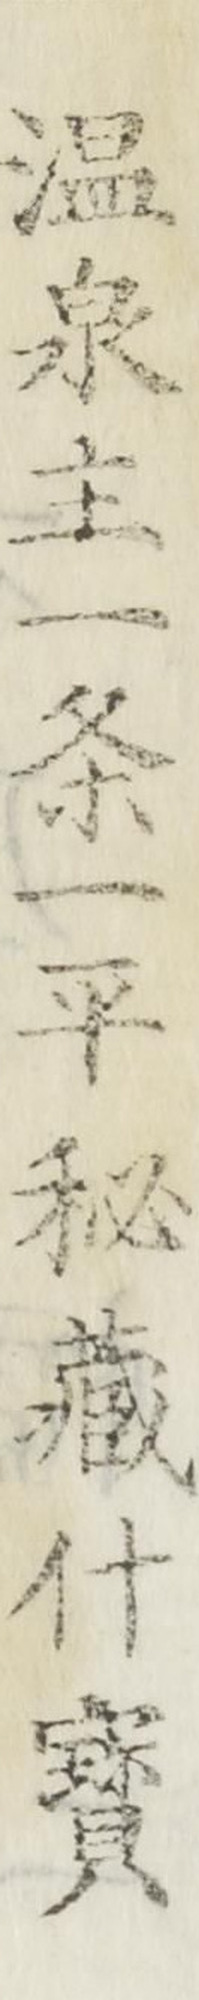温泉主一条一平秘蔵什宝
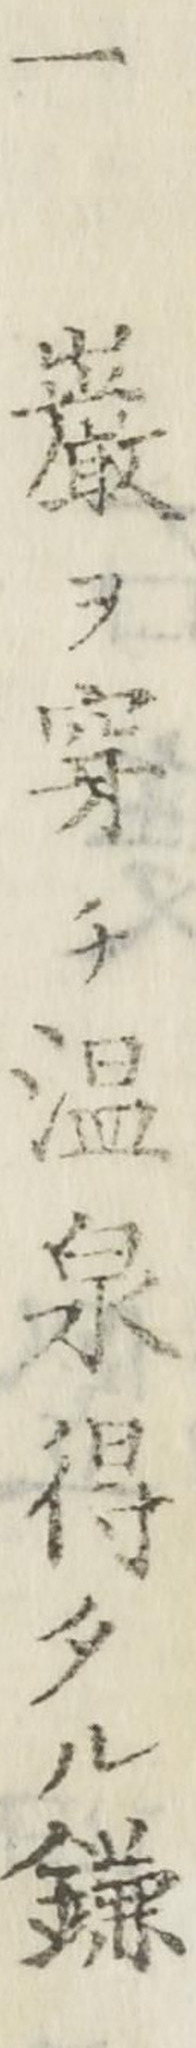一巌ヲ穿チ温泉得タル鎌
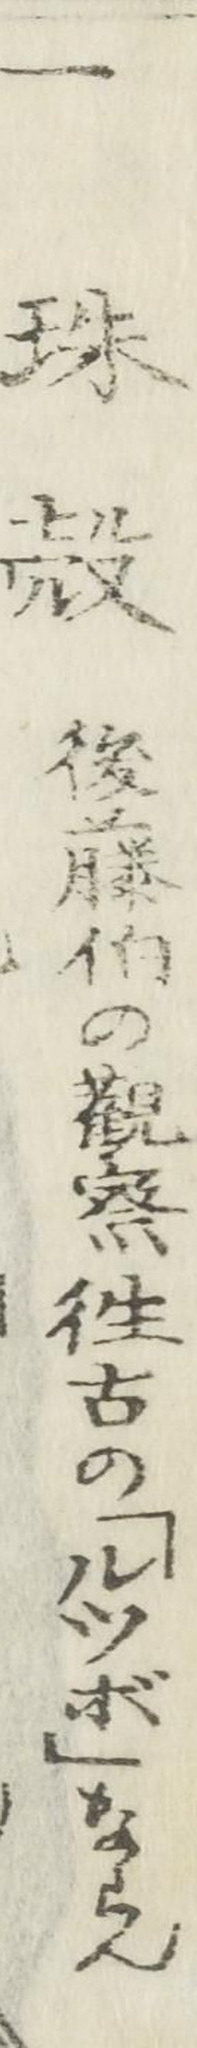一珠殻後藤伯の観察往古の「ルツボ」ならん
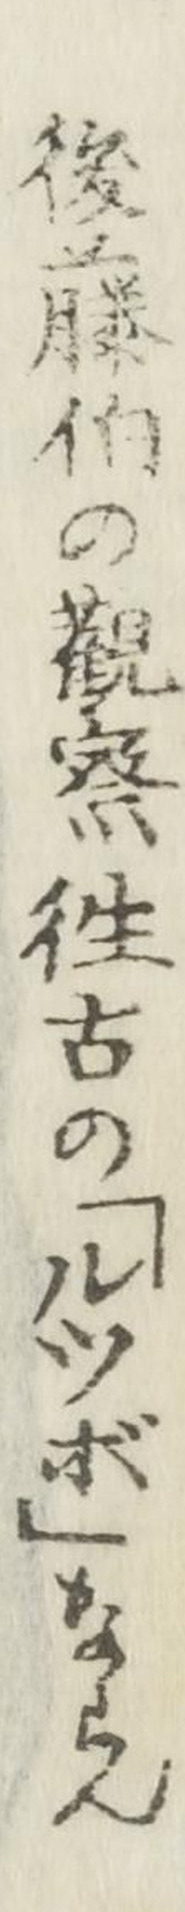一珠殻後藤伯の観察往古の「ルツボ」ならん
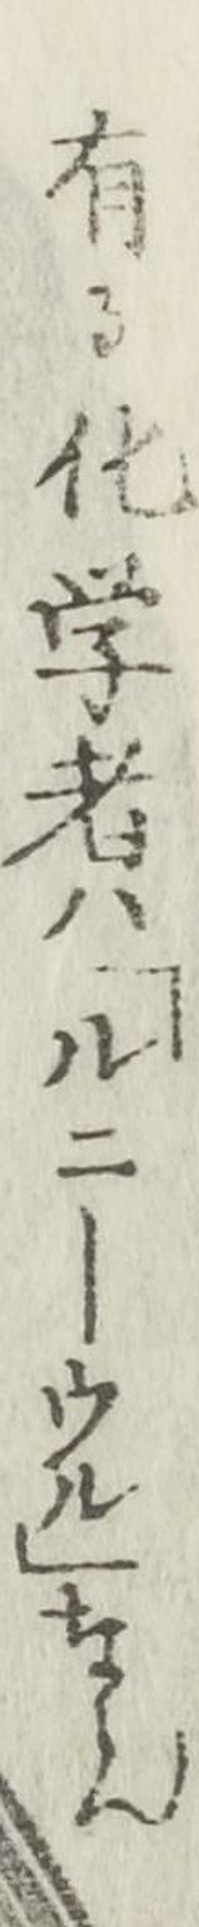或科学者は「ルニーウル」ならん
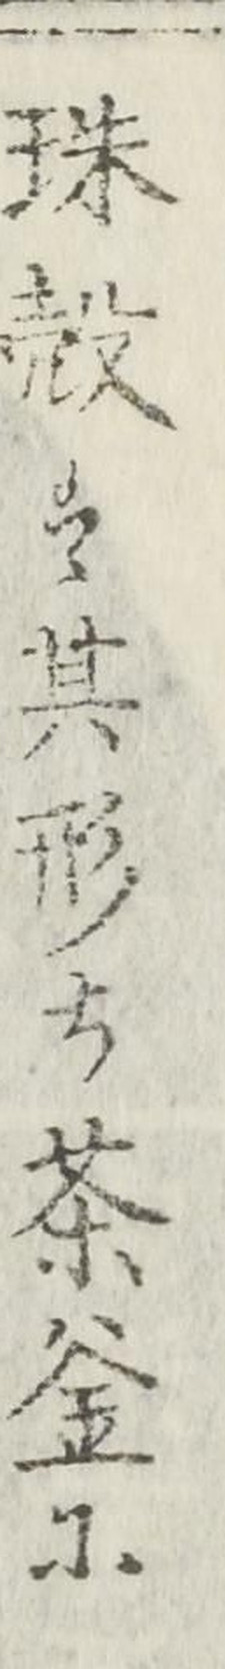珠殻は其形ち茶釜に
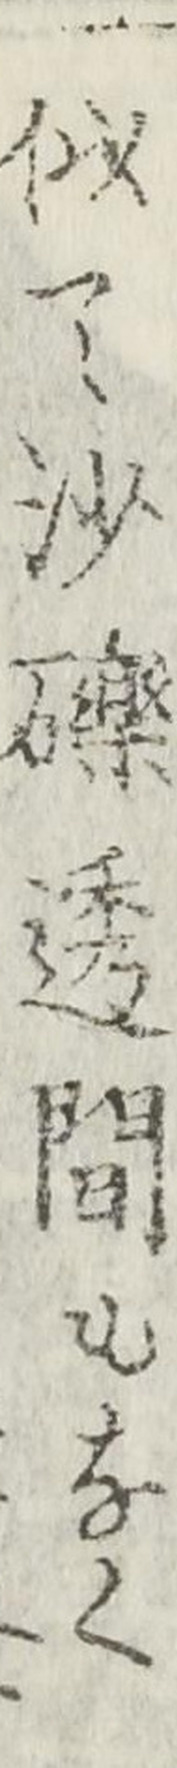似て沙礫透間もなく
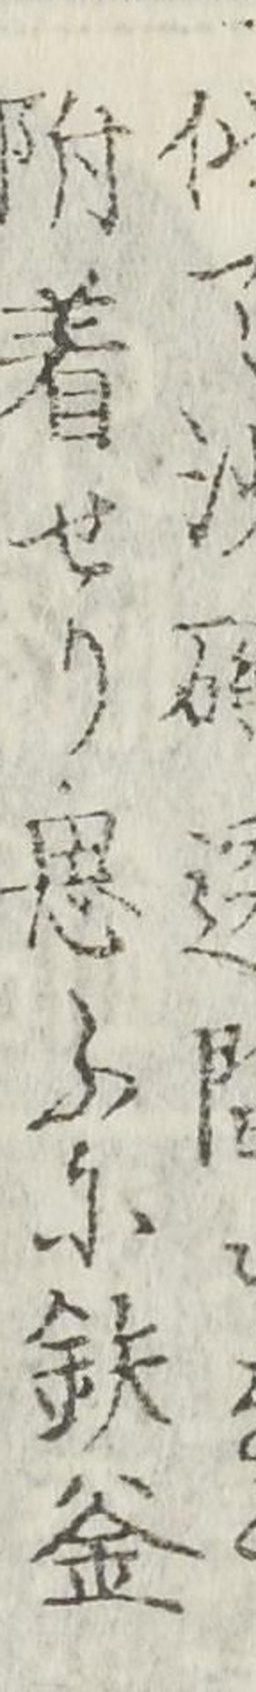附着せり思ふに鉄釜
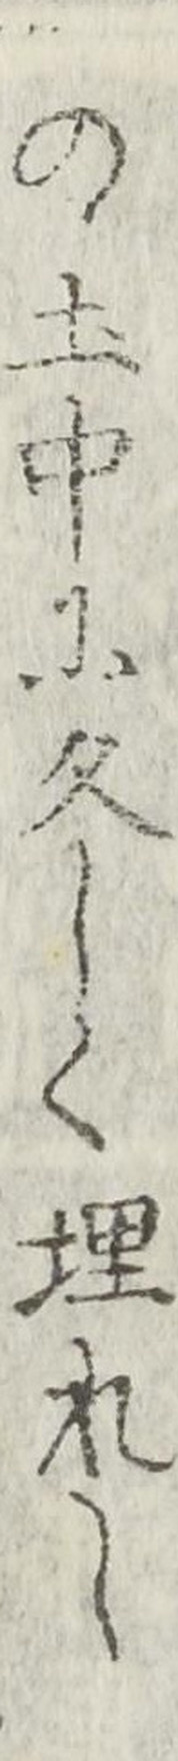の土中に久しく埋れし
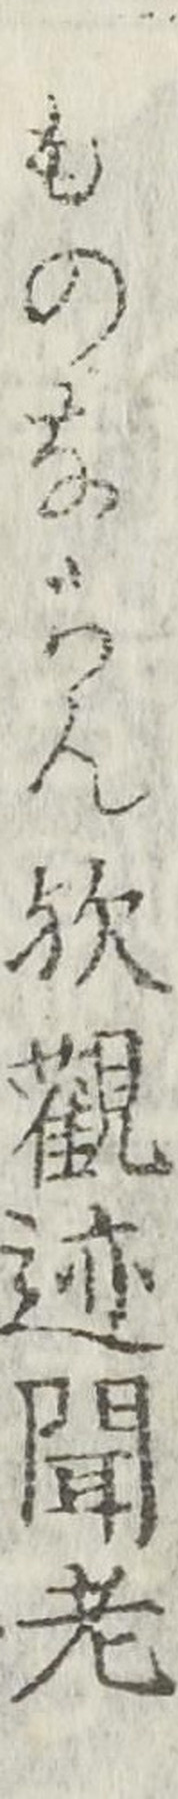ものならん歟観跡聞老
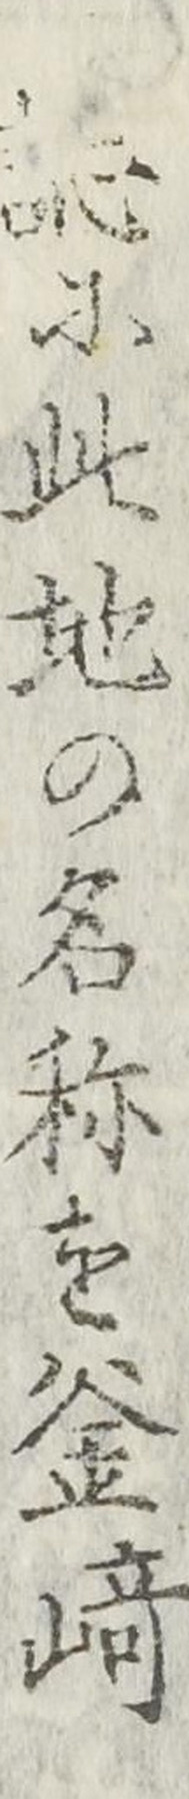誌に此地の名称を釜崎
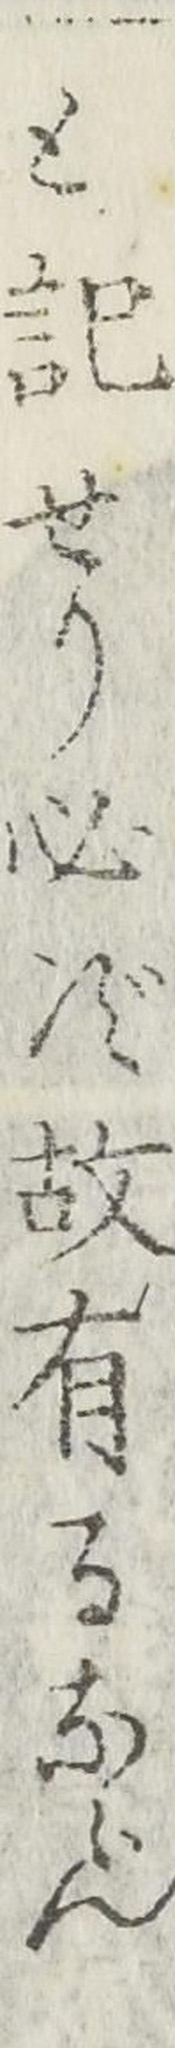と記せり必ず故有るならん
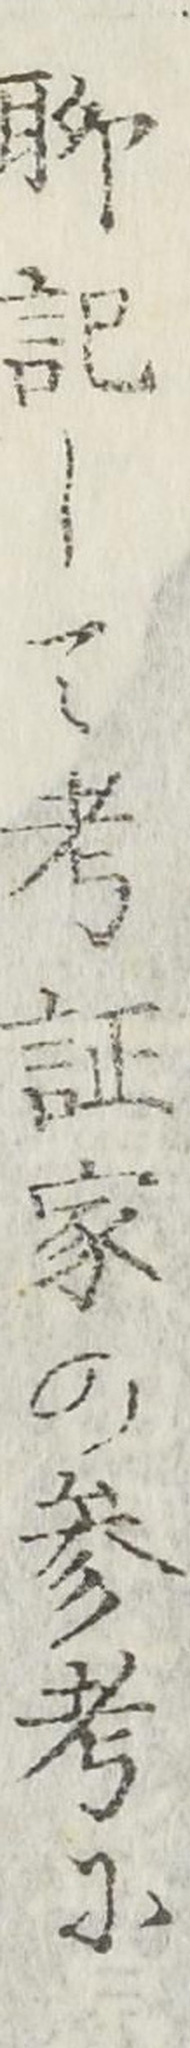聊記して考証家の参考に
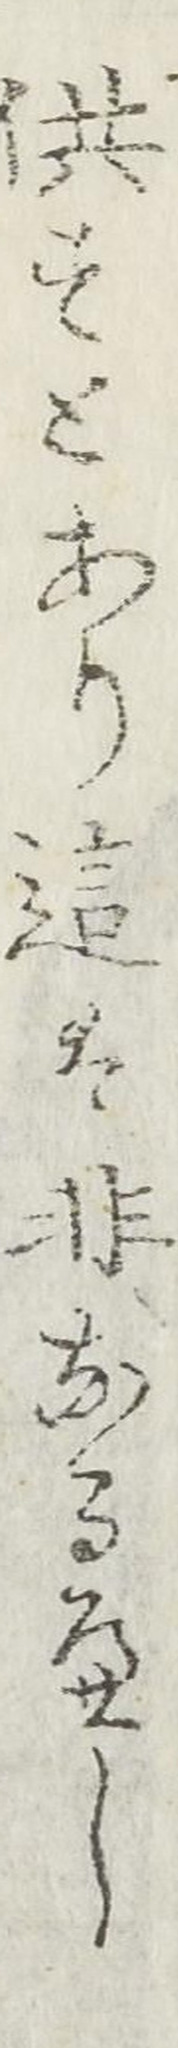供すとあり這は非なるへし
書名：鎌先温泉由來記
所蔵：東京大学地震研究所図書室 Earthquake Research Institute Library, The University of Tokyo, JAPAN
